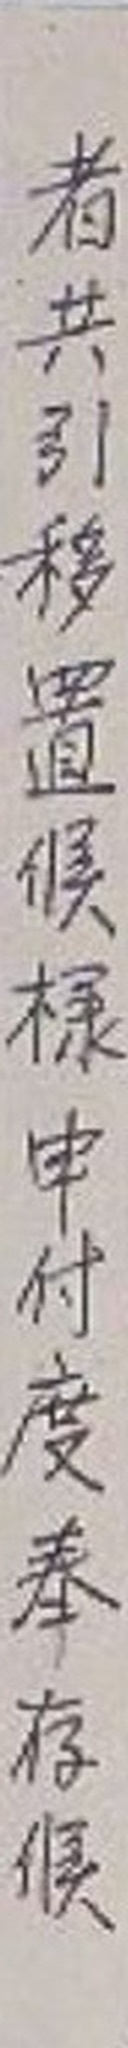者共引移置候様申付度奉存候
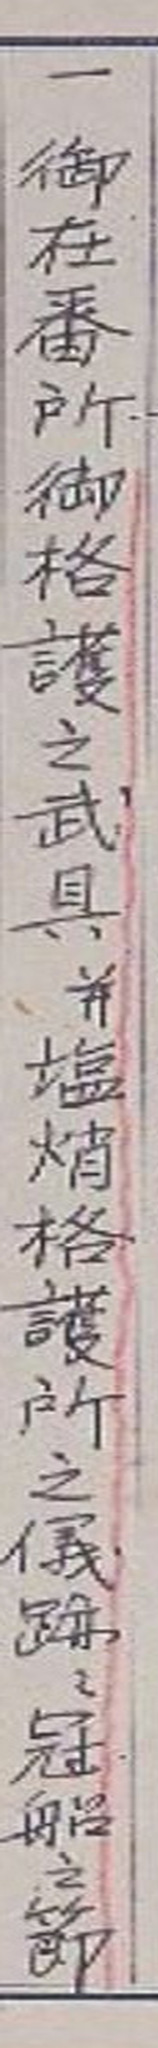一御在番所御格護之武具并塩焇格護所之儀跡々冠船之節

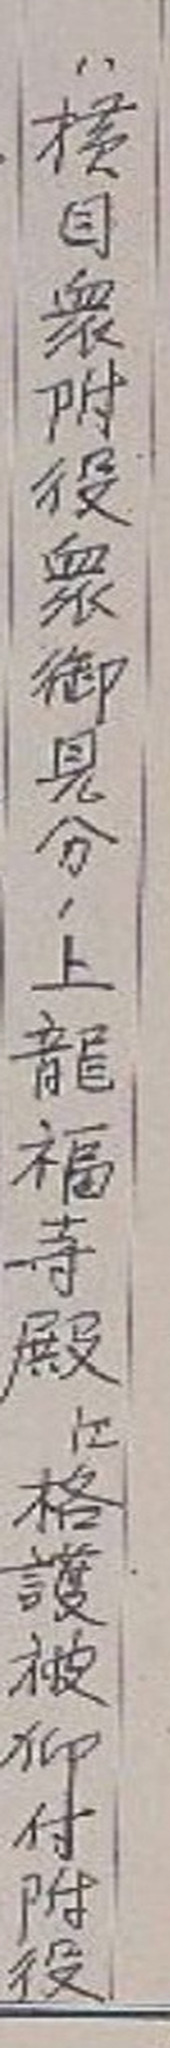は横目衆附役衆御見分の上龍福寺殿え格護被仰付附役
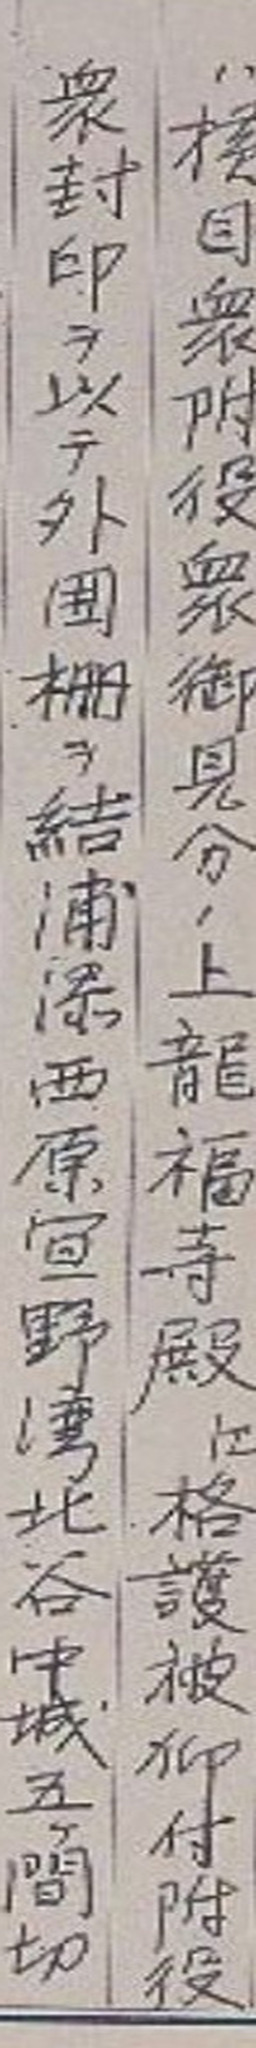衆封印を以て外囲柵を結浦添西原宜野湾北谷中城五ヶ間切
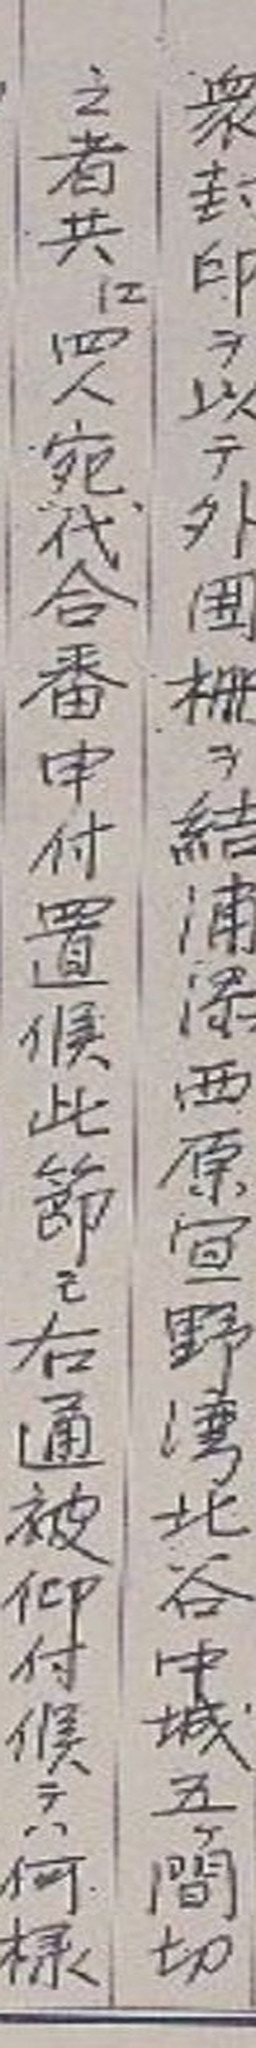之者共え四人宛代合番申付置候此節も右通被仰付候ては何様
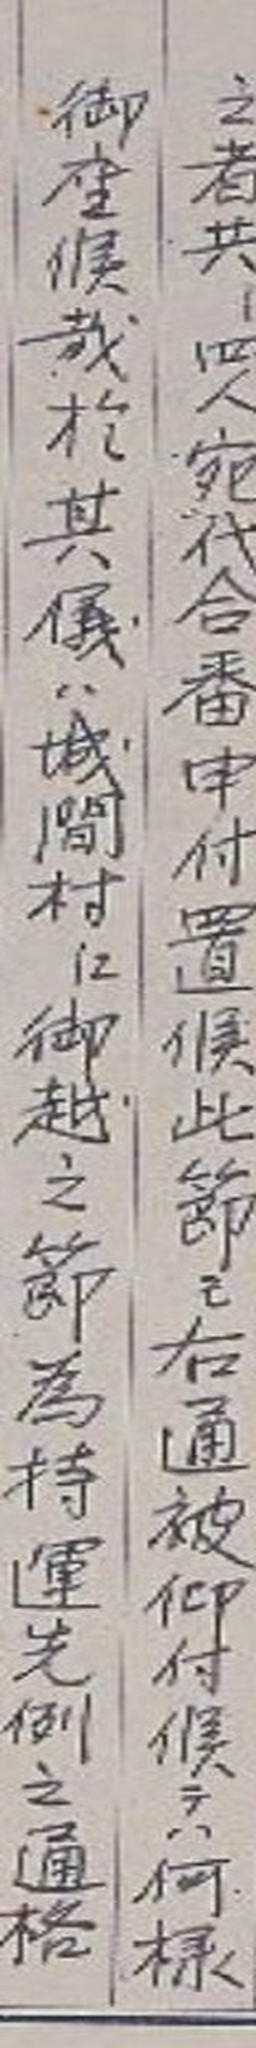御座候哉於其儀は城間村え御越之節為持運先例之通格
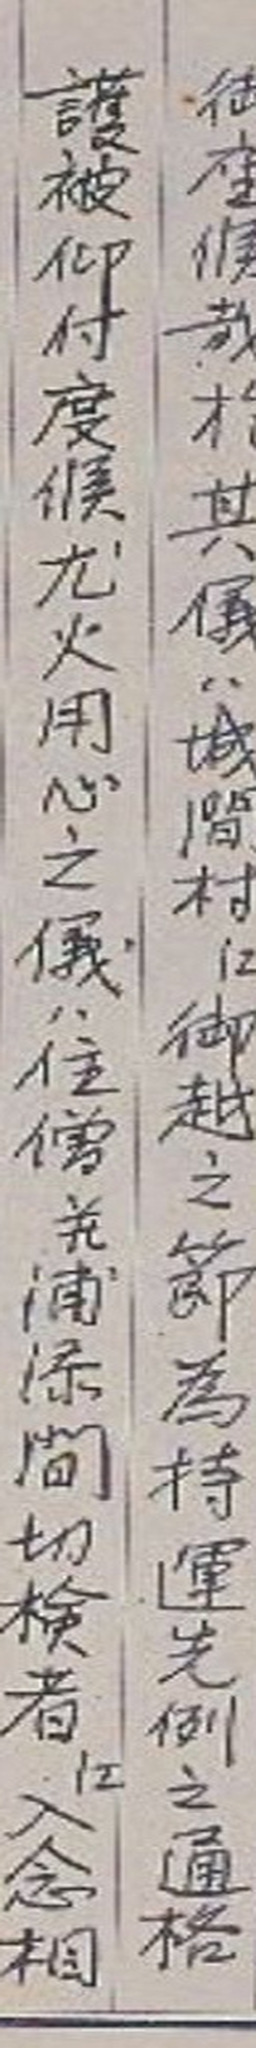護被仰付度候尤火用心之儀は住僧并浦添間切検者え入念相
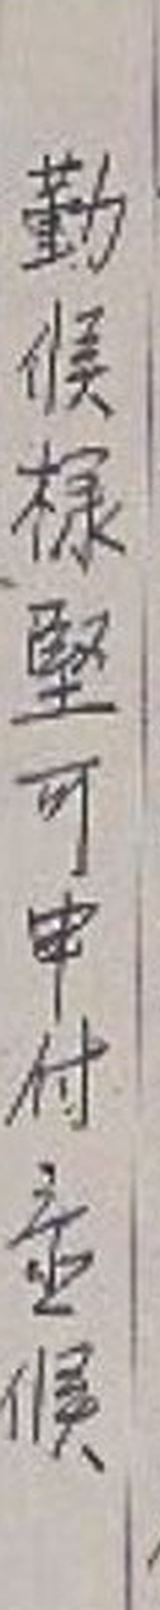勤候様堅可申付置候
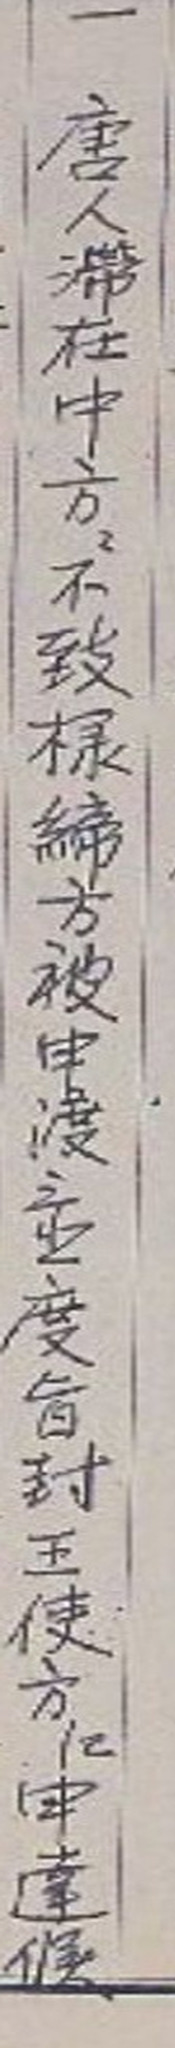一唐人滞在中方々不致様締方被申渡置度旨封王使方え申達候
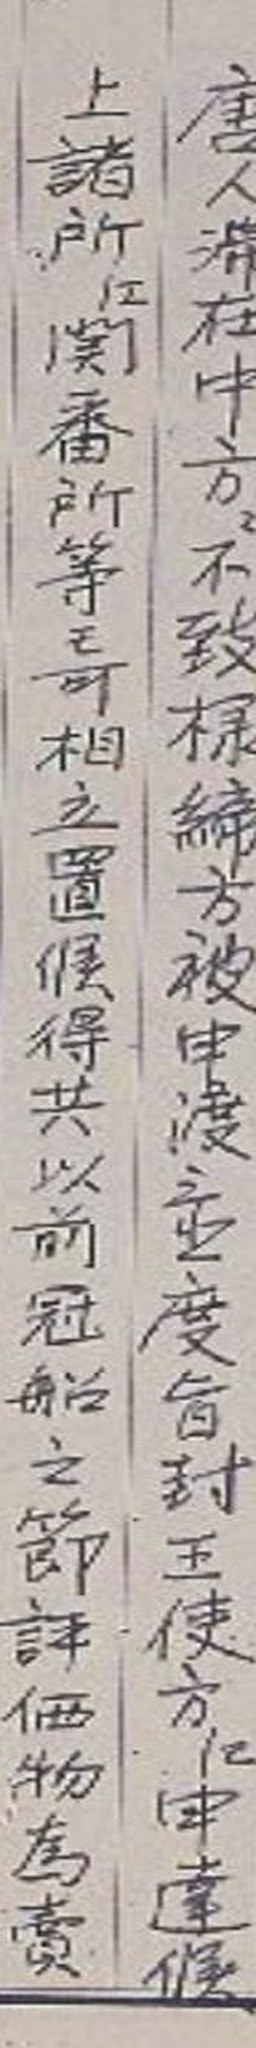上諸所え関番所等も可相立置候得共以前冠船之節評価物為売
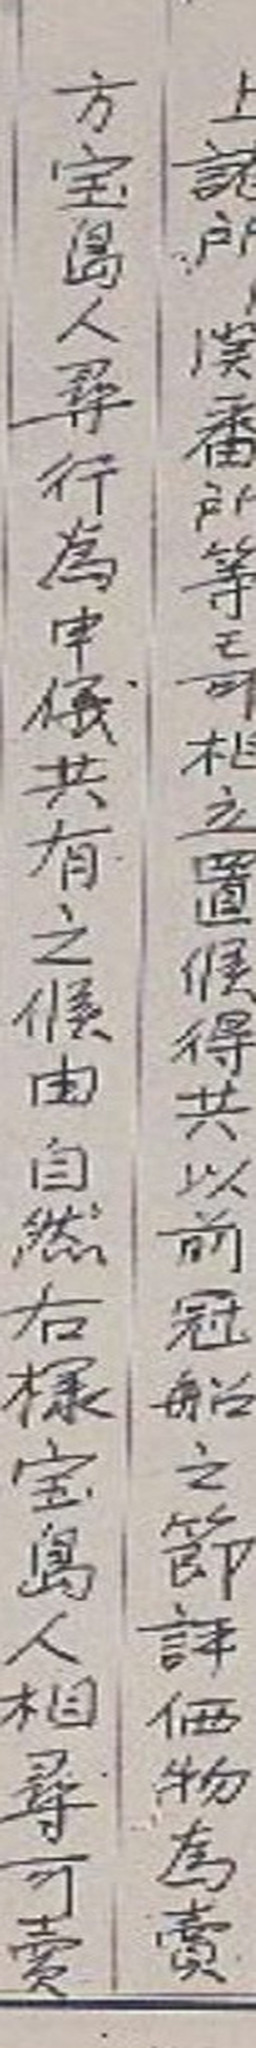方宝島人尋行為申儀共有之候由自然右様宝島人相尋可売
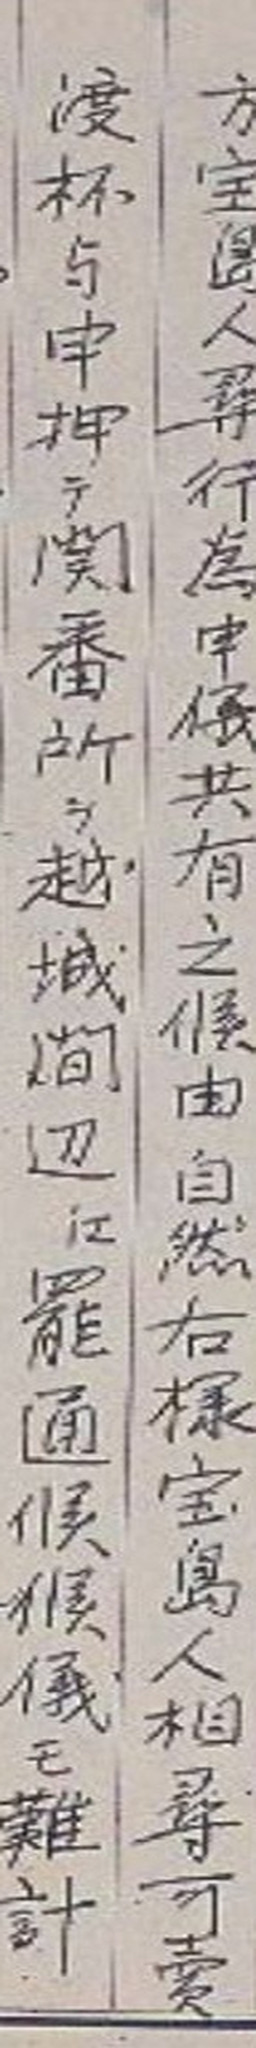渡抔と申押て関番所を越城間辺え罷通候候儀も難計
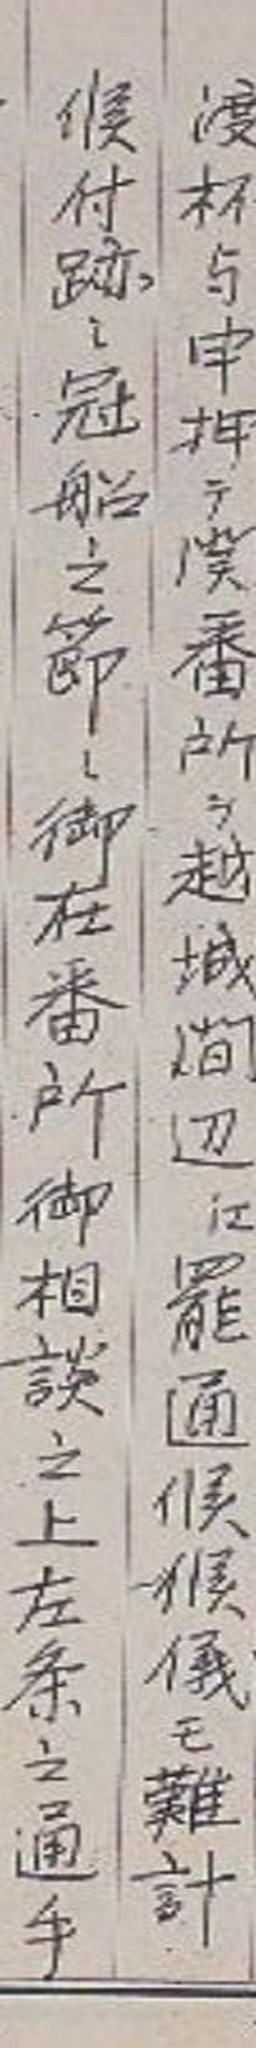候付跡々冠船之節々御在番所御相談之上左条之通手
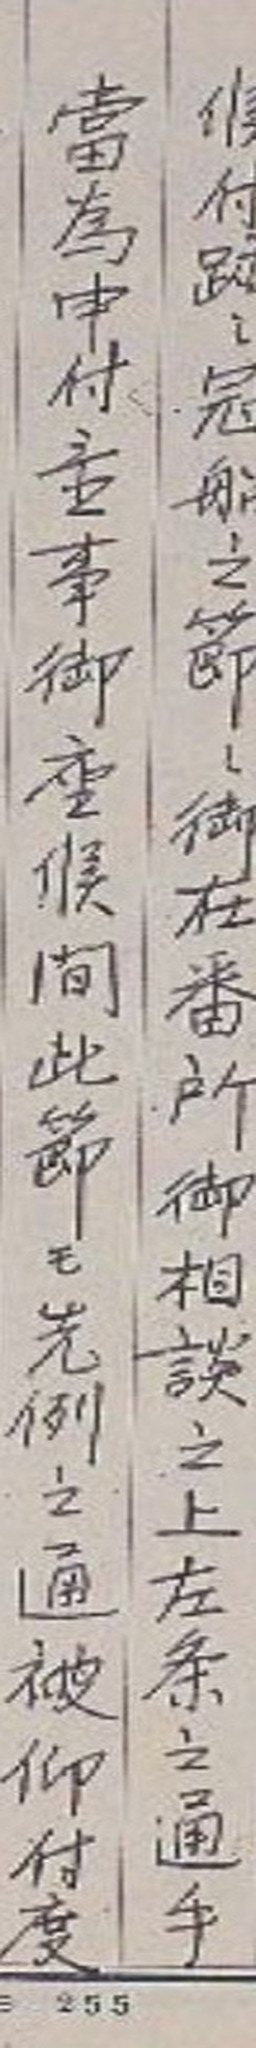当為申付置事御座候間此節も先例之通被仰付度
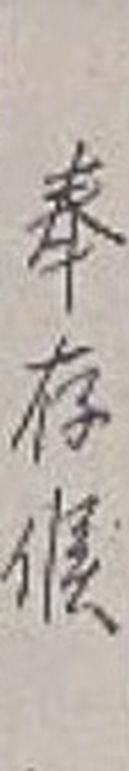奉存候
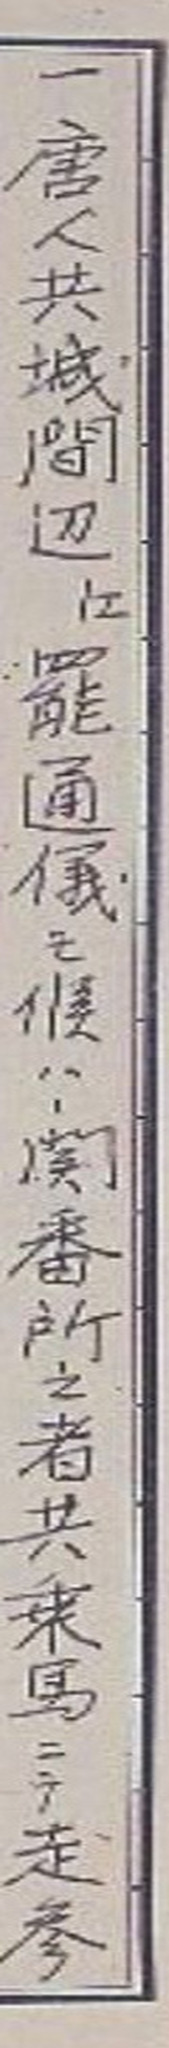一唐人共城間辺え罷通儀も候はゝ関番所之者共乗馬にて走参
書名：支那冊封使来琉諸記 下巻
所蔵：University of the Ryukyus Library
